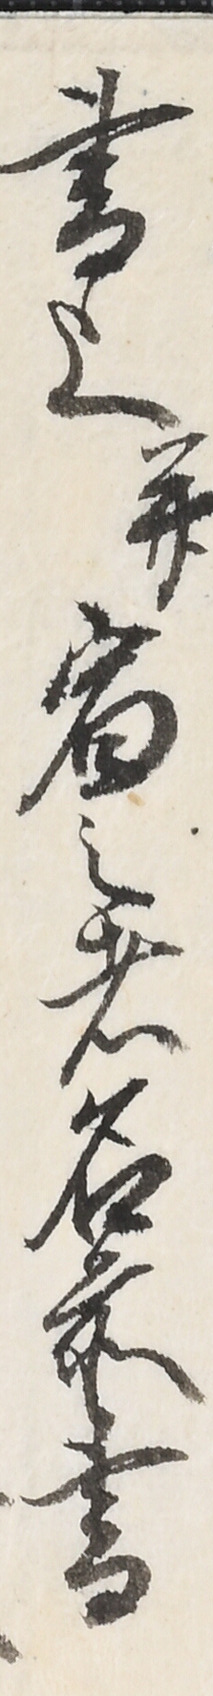書上幷宿之者名前書
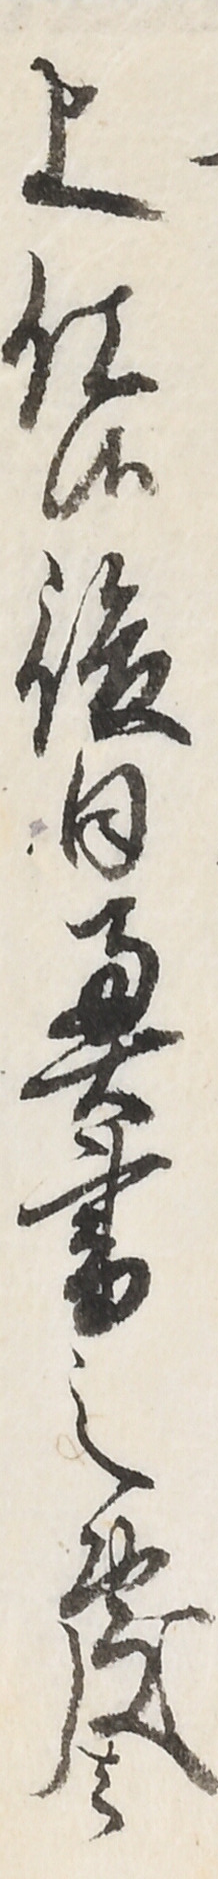上仕候後日奥書之処者
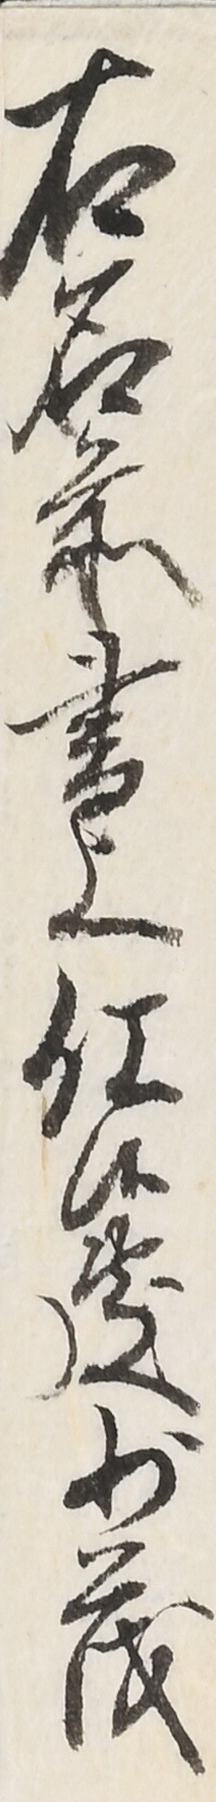右名前書上仕候処少茂
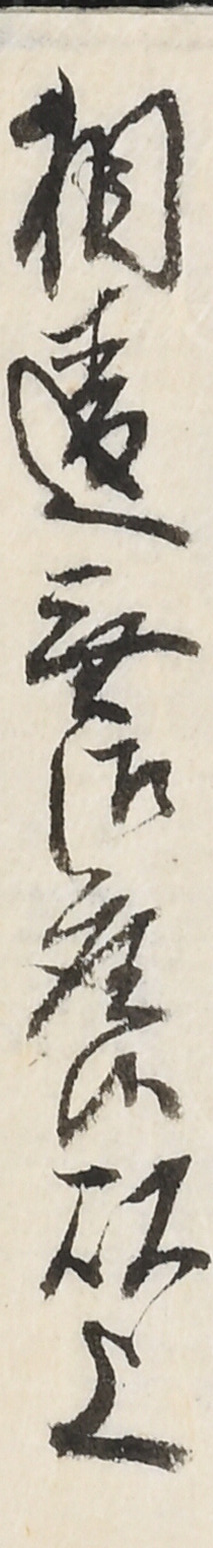相違無御座候以上
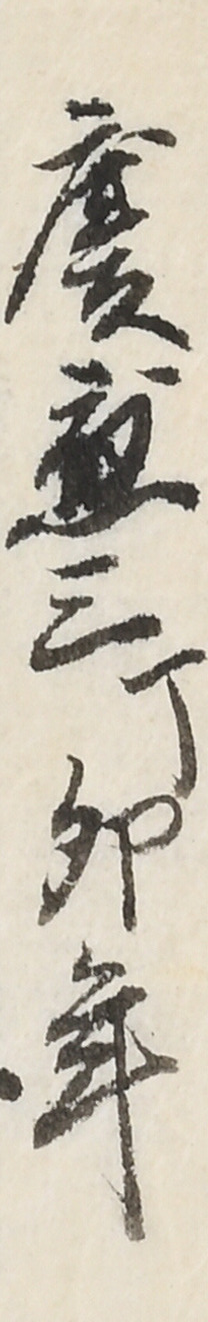慶應三丁卯年
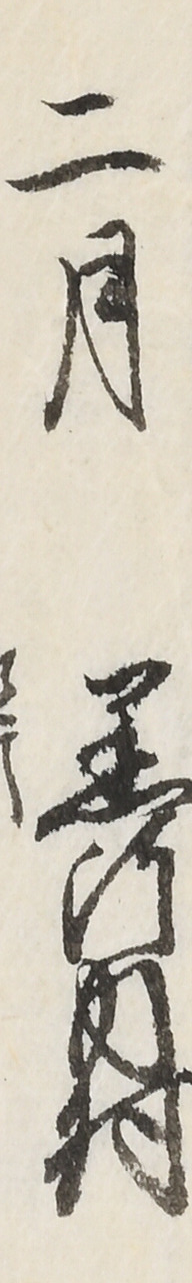二月黒河内村
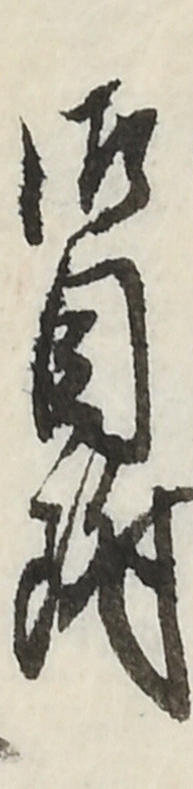御目附
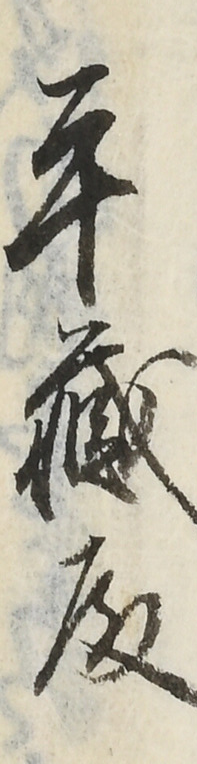平蔵殿
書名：慶應三丁卯年二月石切名前取調書上帳
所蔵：伊那市立高遠町図書館・合同会社AMANE
